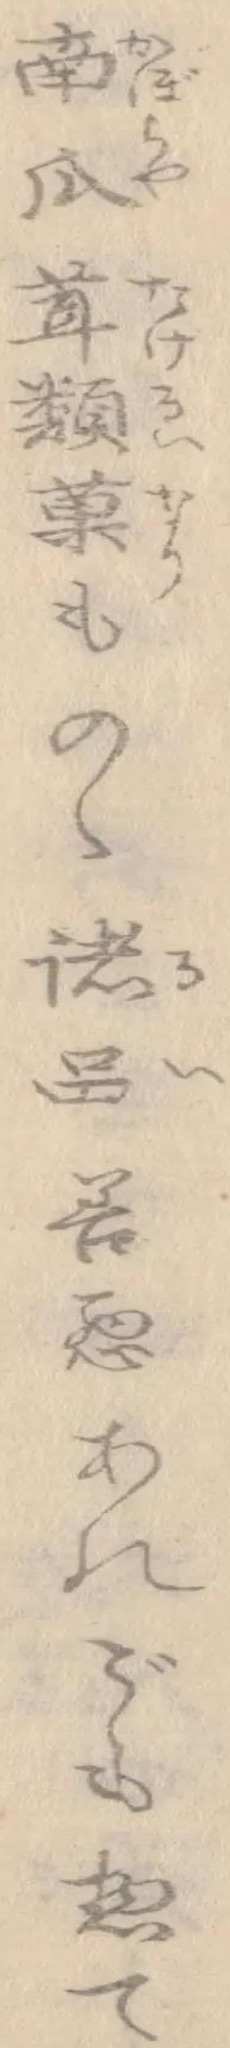南瓜茸類菓ものゝ諸品善悪あれども惣て
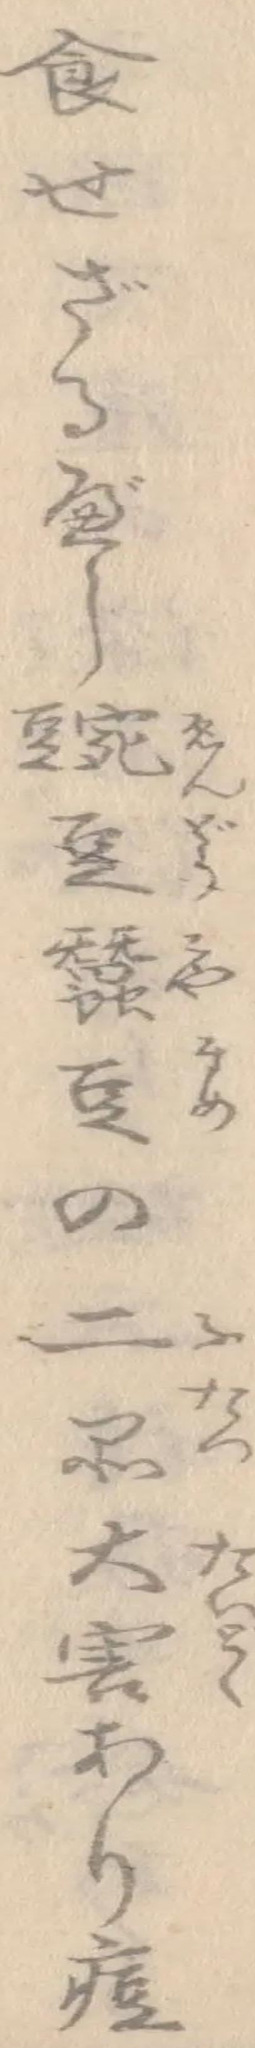食せざるべし豌豆蚕豆の二品大害あり痘
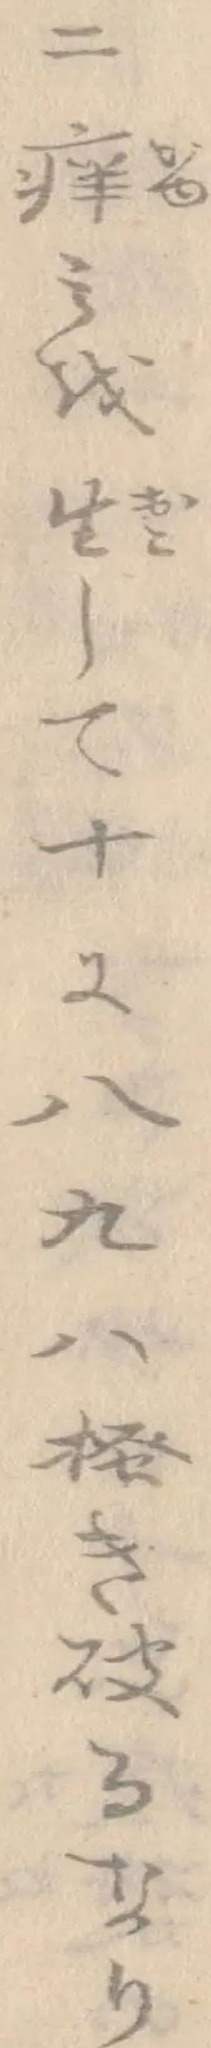に痒みを生して十に八九は掻き破るなり
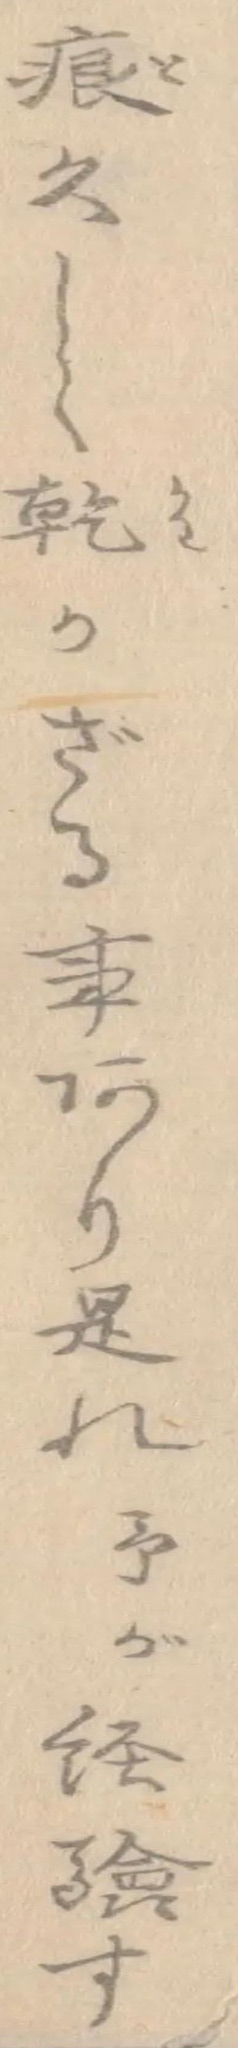痕久しく乾かざる事なり是予が経験す
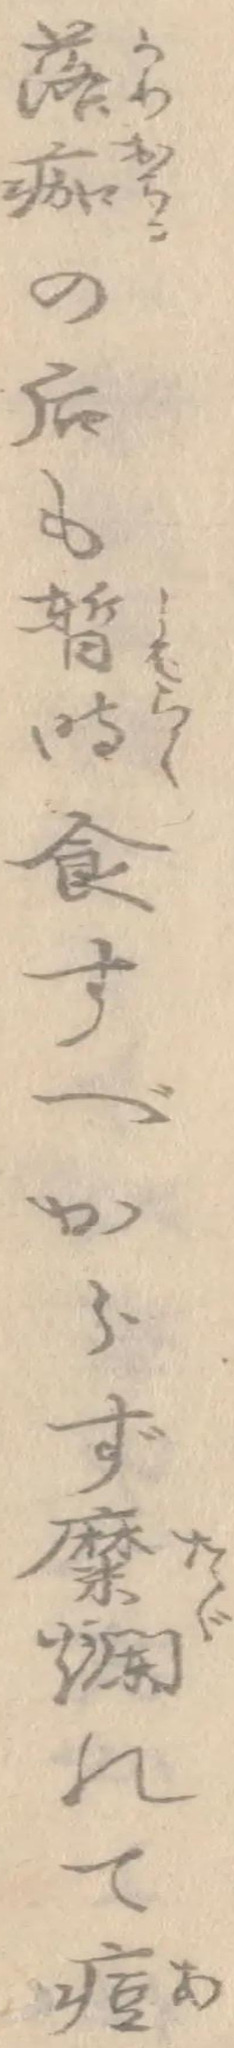落痂の后も暫時食すべからず摩蛹れて痘

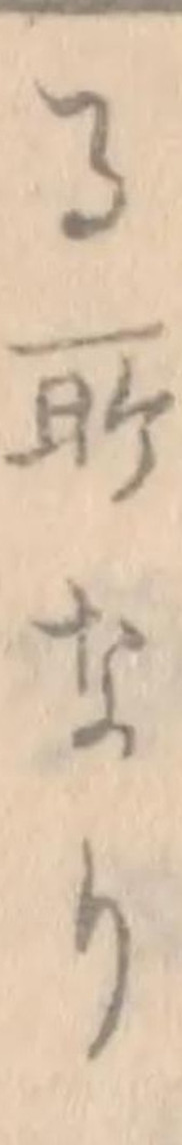事所なり
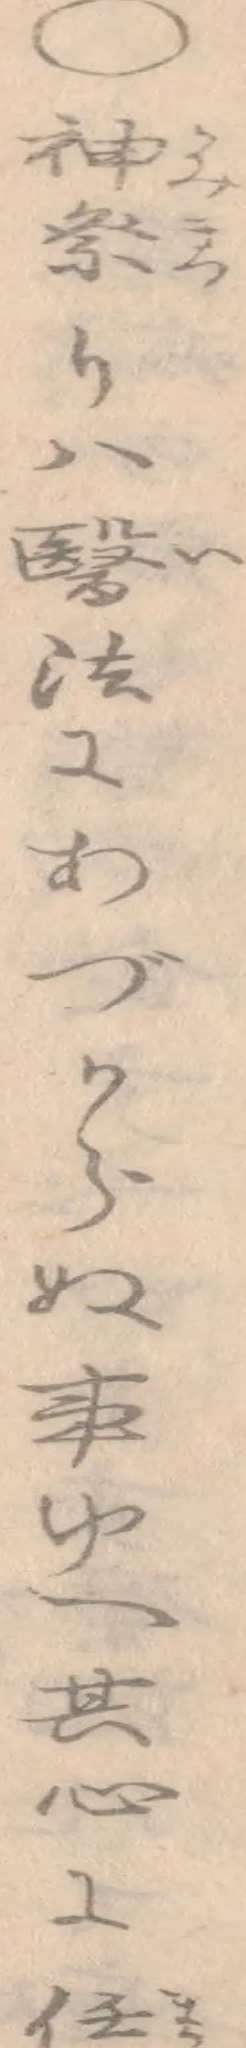○神祭りは醫法にあづからぬ事ゆへ其心に任
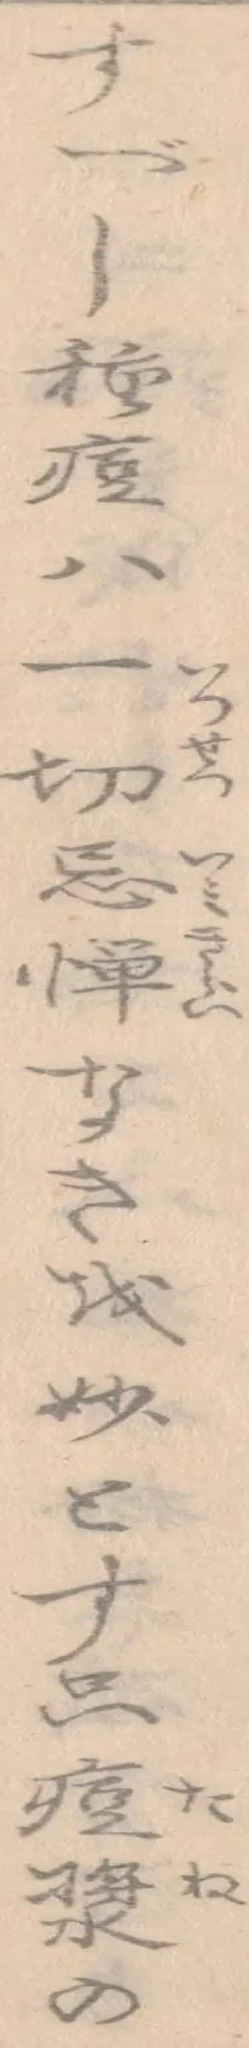すべし種痘は一切忌憚なきを妙とす只痘漿の
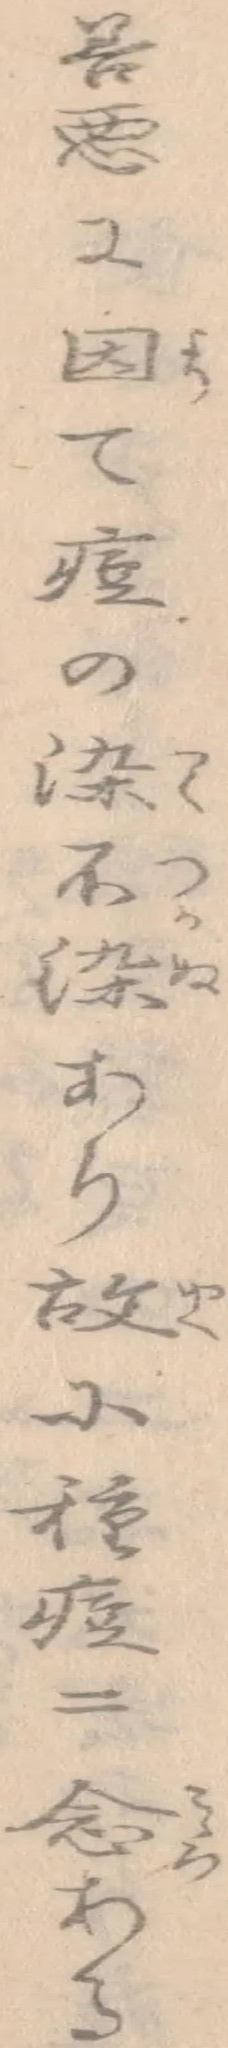善悪に因て痘の染不染あり故に種痘に念ある
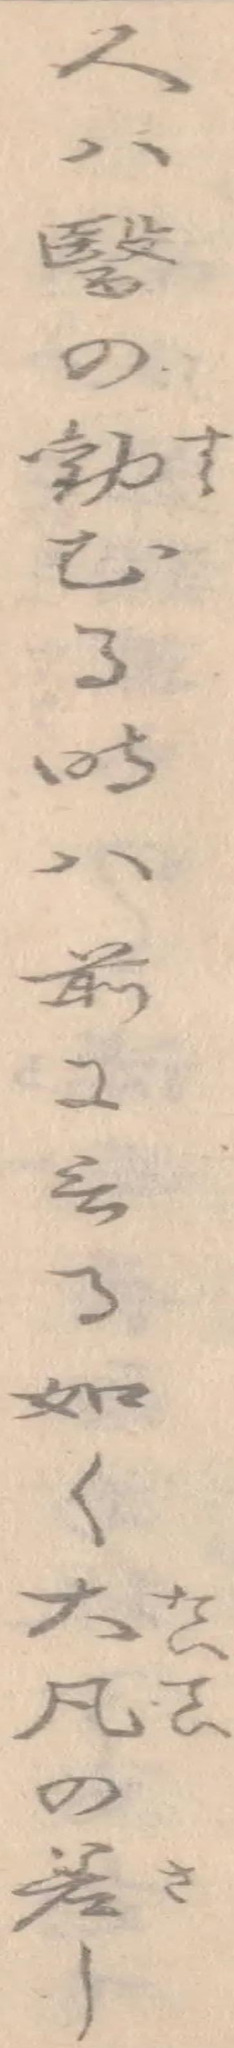人は醫の動むる時は前に言る如く大凡の差し
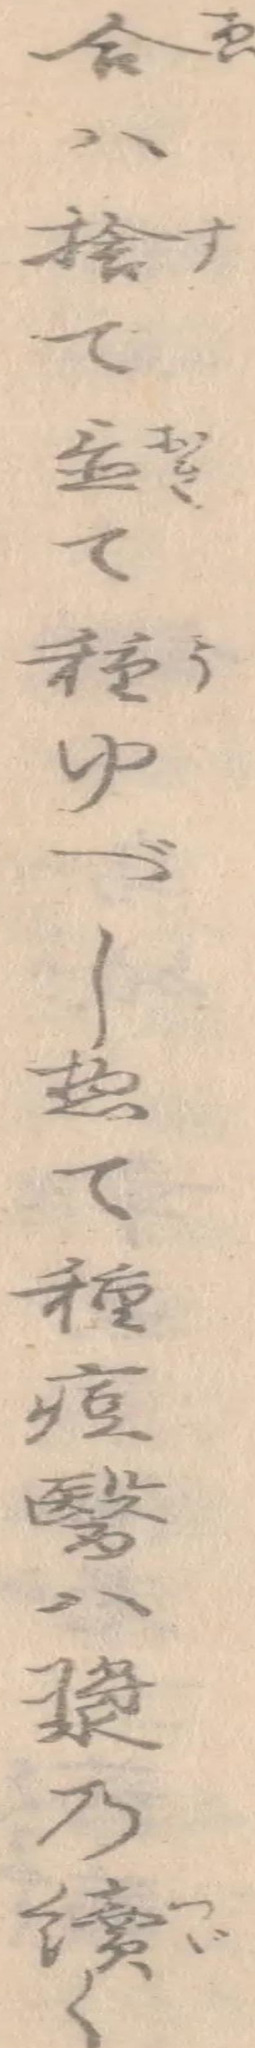合は捨て置て種ゆべし惣て種痘醫は漿の続く
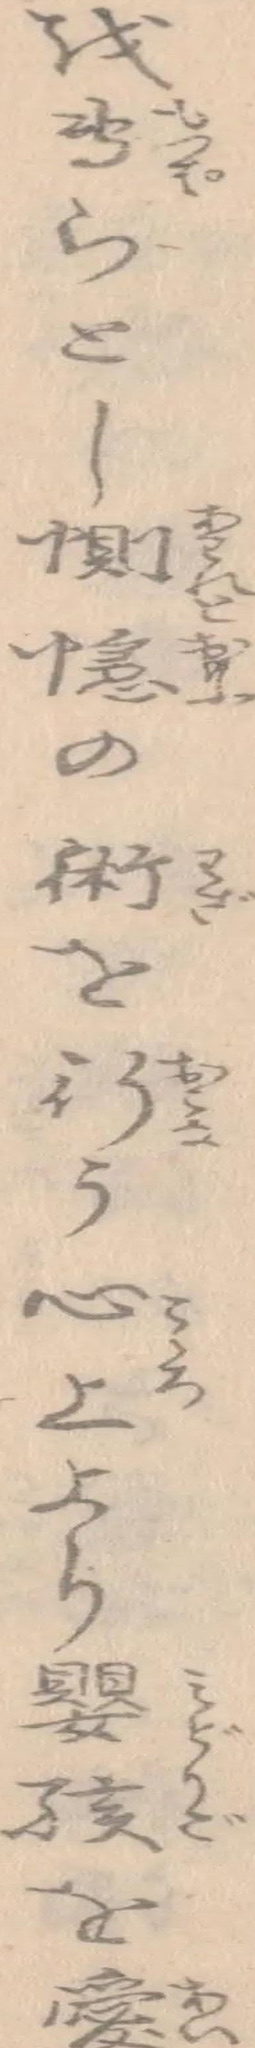を専らとし棚塩の術を行う心上より嬰孩を愛
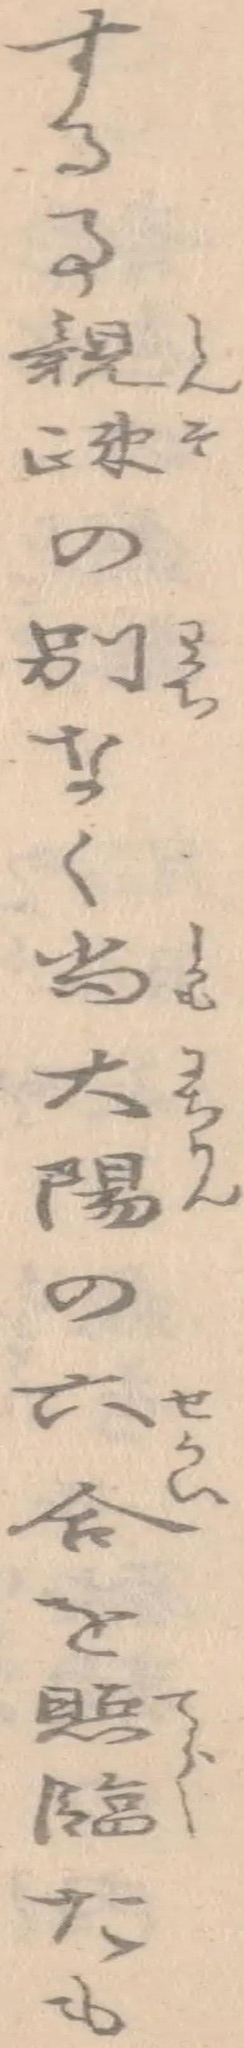する事親疎の別なく当大陽の六合を照臨たも
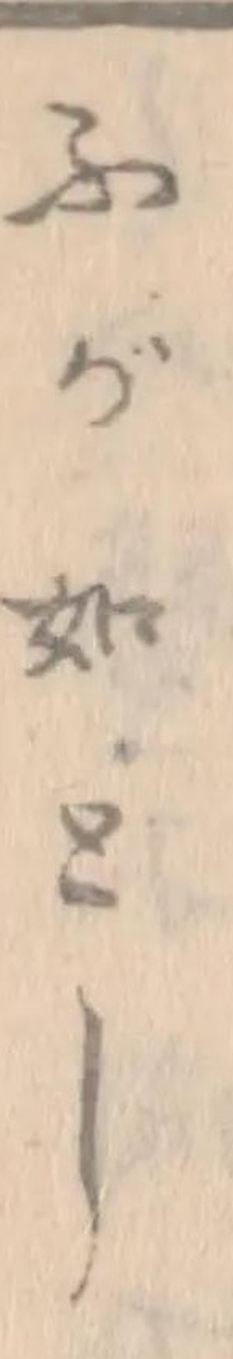ふが如とし
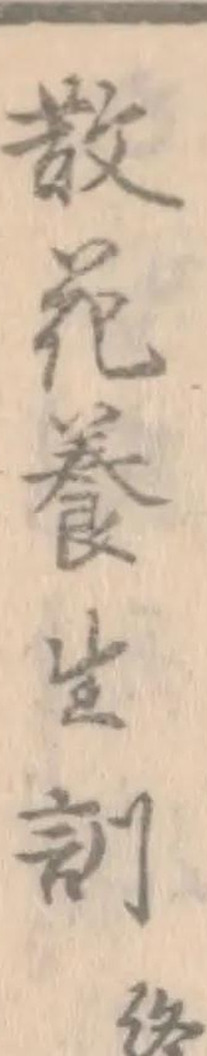散花養生訓終
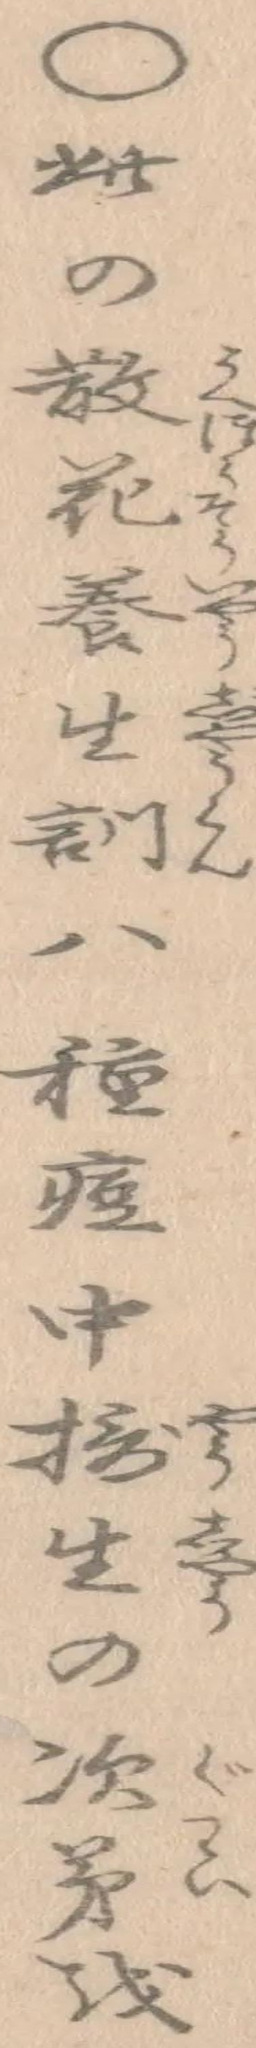○此の散花養生訓は種痘中摂生の次第を
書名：散花養生訓
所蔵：国立国会図書館 National Diet Library, JAPAN
